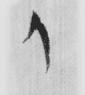人
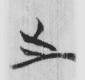之
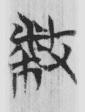敝
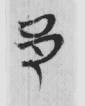邑
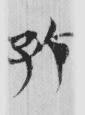孤
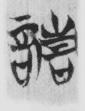請
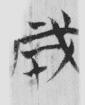成
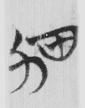男
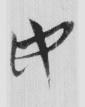女
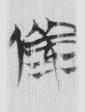備
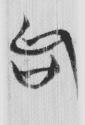句
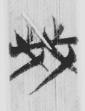{戈戈}
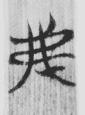弗
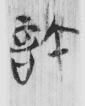許
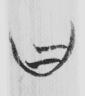曰
